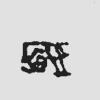匿
